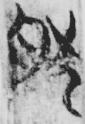肰（然）
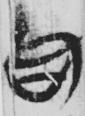句（後）
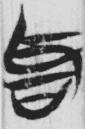○（始）
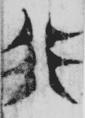行
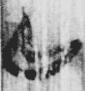㠯（以）
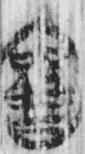噞（儉）
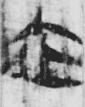衣
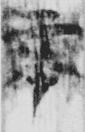不
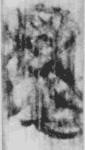褻
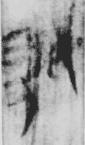{女𡵂}（美）
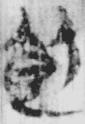飤（食）
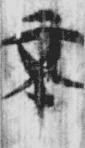不
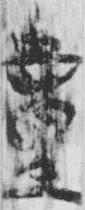童（重）
